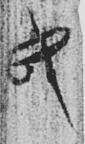女（如）
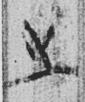之
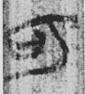可（何）
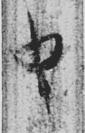中（仲）
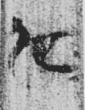尼
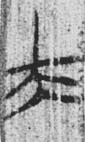夫
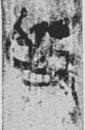○（賢）
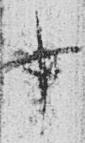才
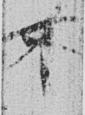不
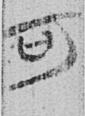可
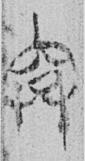○（掩）
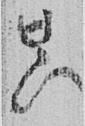也
